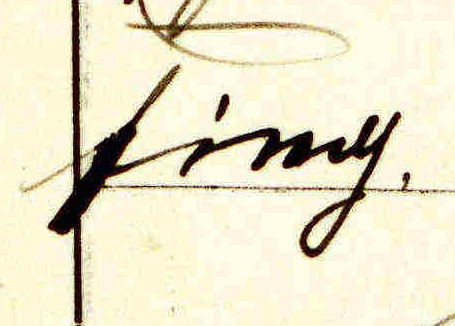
sing.
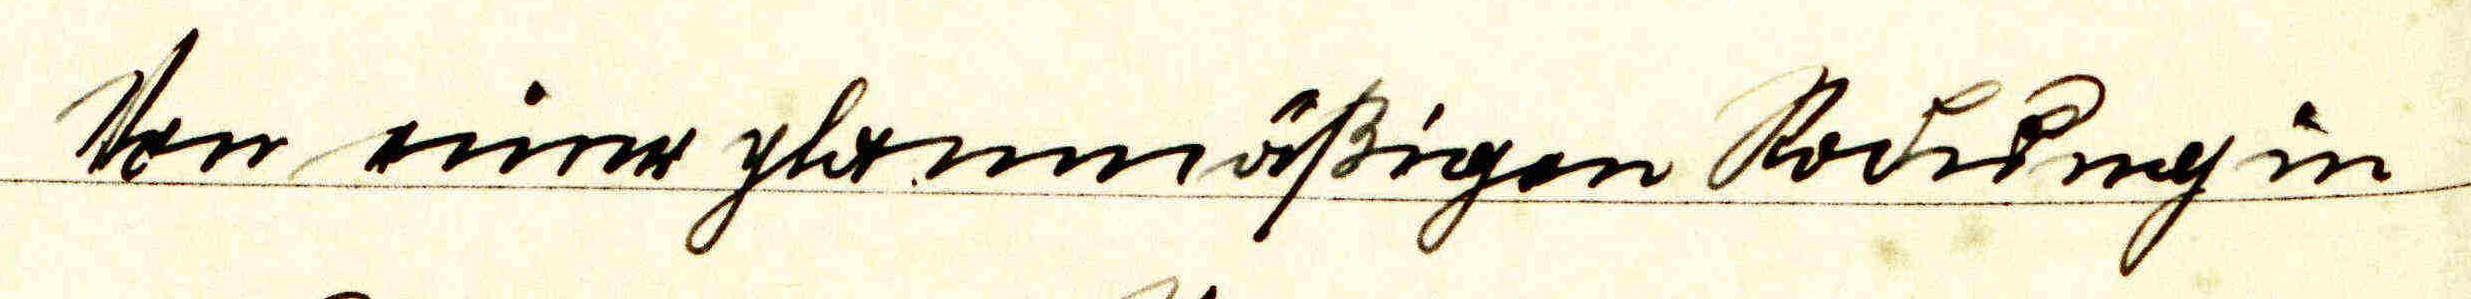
Von einer planmäßigen Rodung in
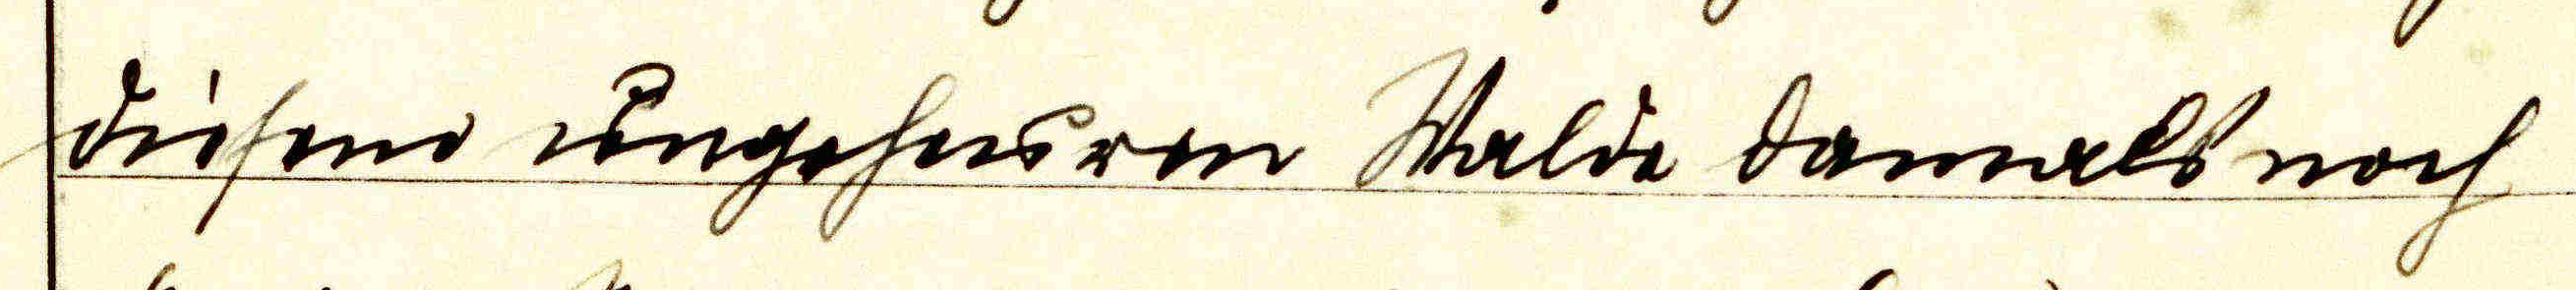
diesem ungeheuren Walde damals noch
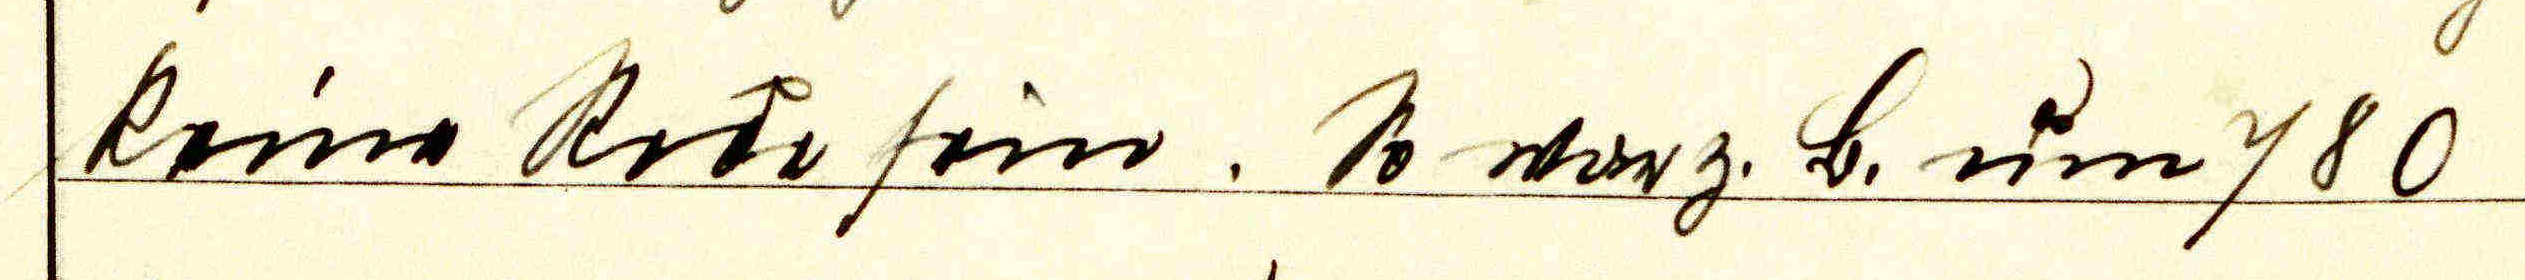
keine Rede sein. So war z.B. um 780
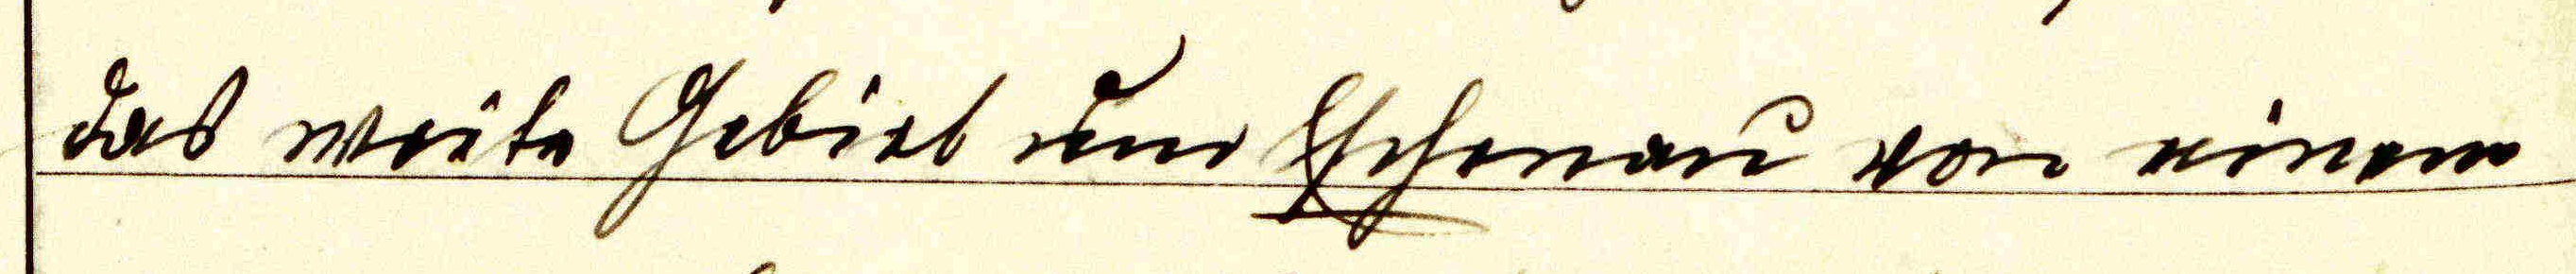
das weite Gebiet um Eschenau von einem
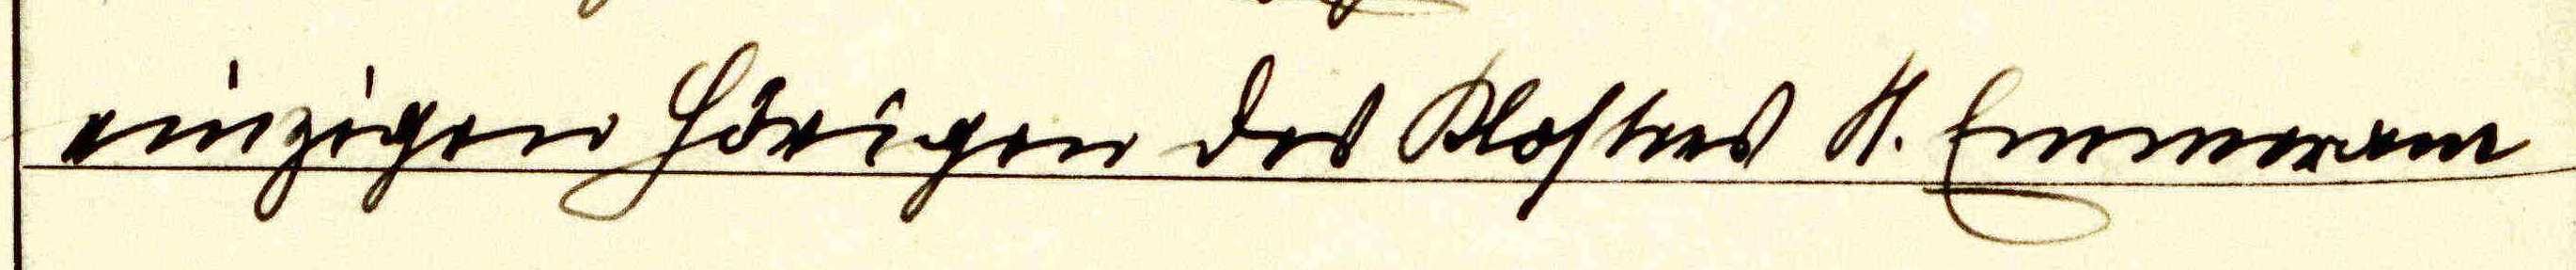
einzigen hörigen des Klosters St. Emmeram
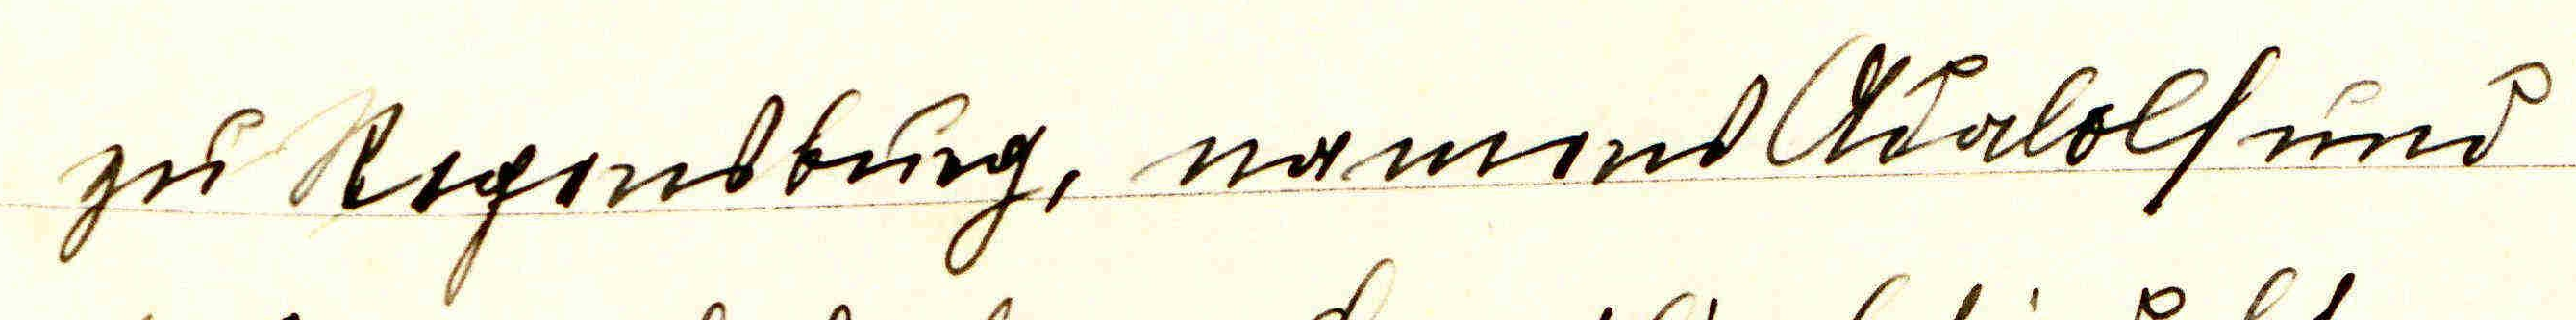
zu Regensburg, namens Adalolf und
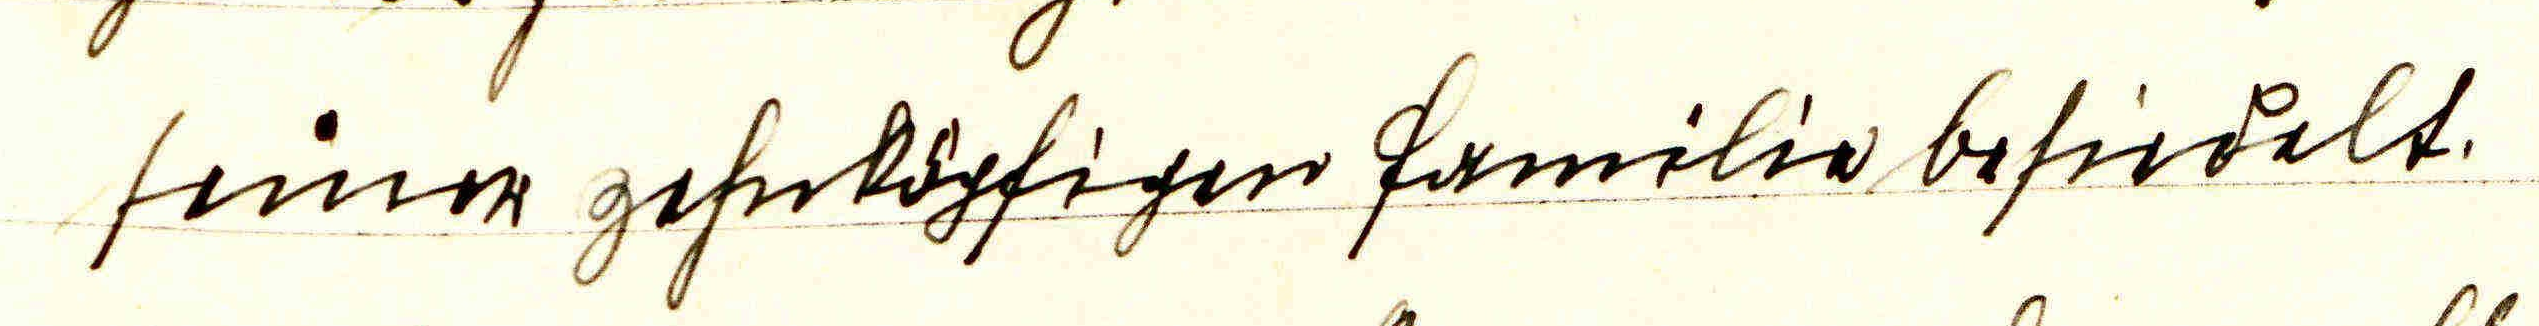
seiner zehnköpfigen Familie besiedelt.
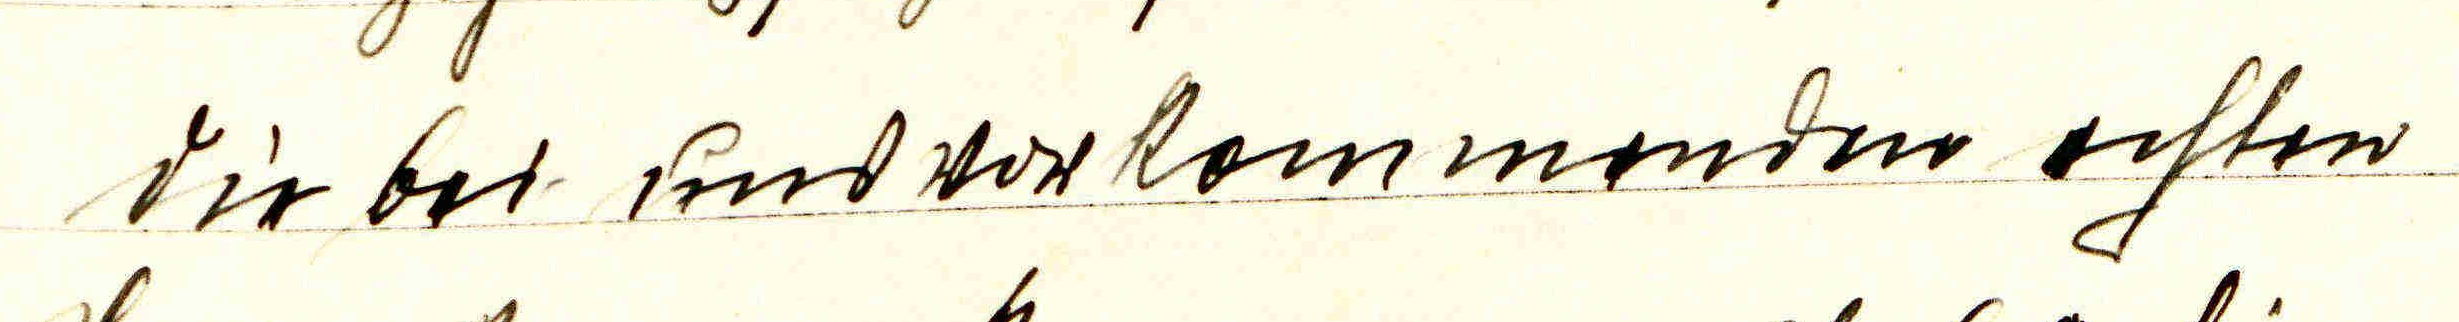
Die bei uns vorkommenden echten
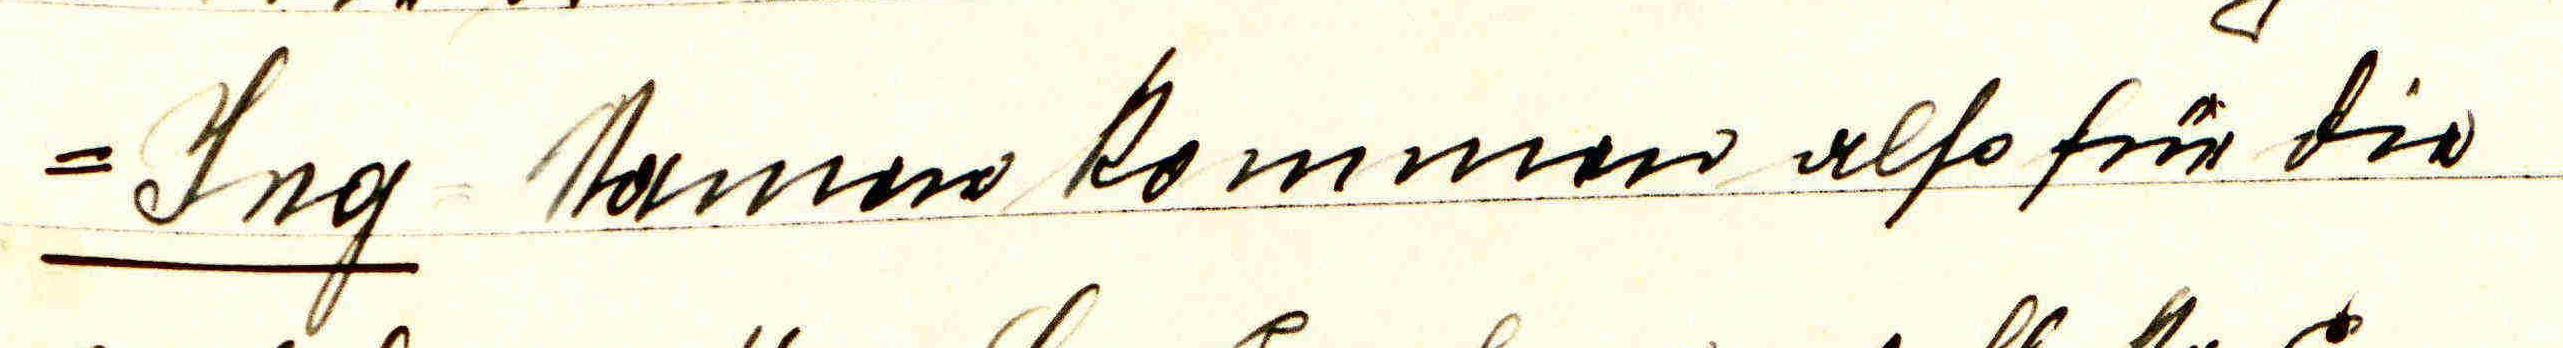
–Ing Namen kommen also für die
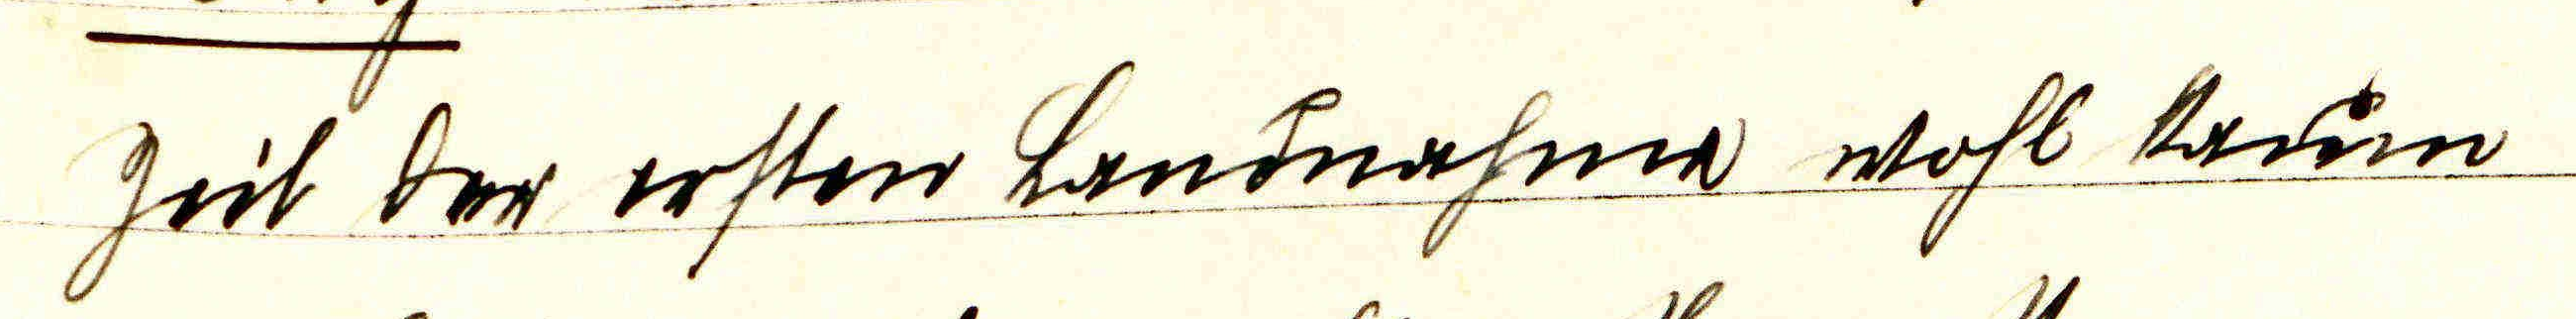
Zeit der ersten Landnahme wohl kaum
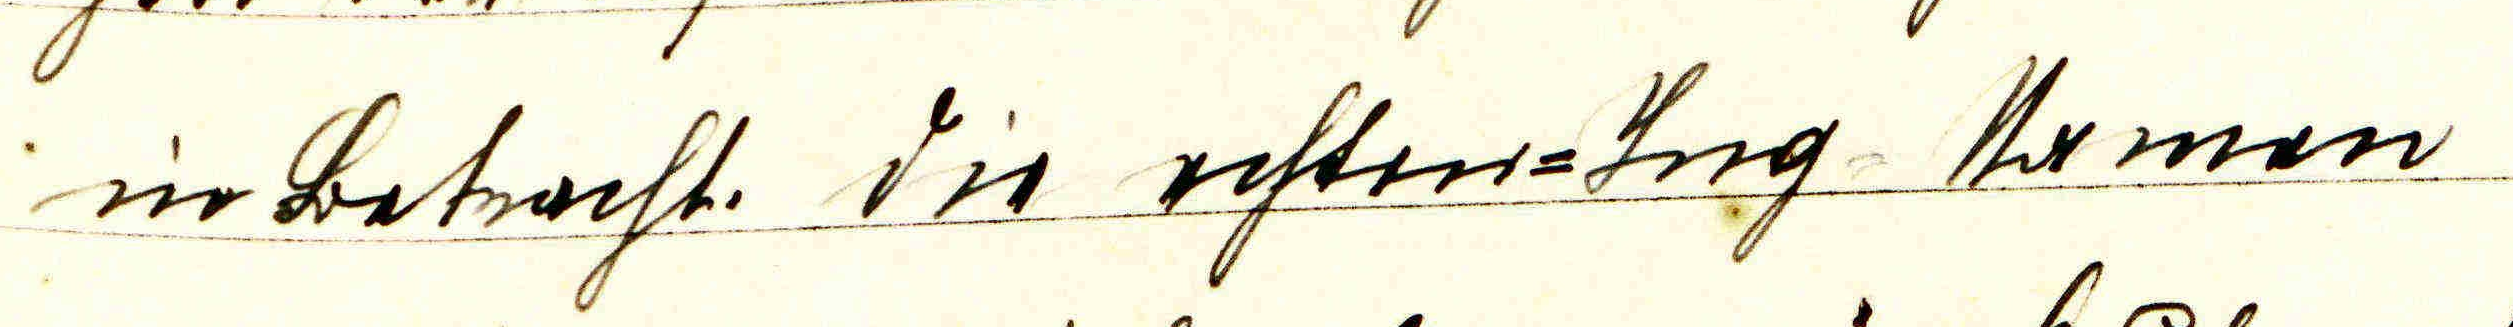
in Betracht. Die echten –Ing Namen
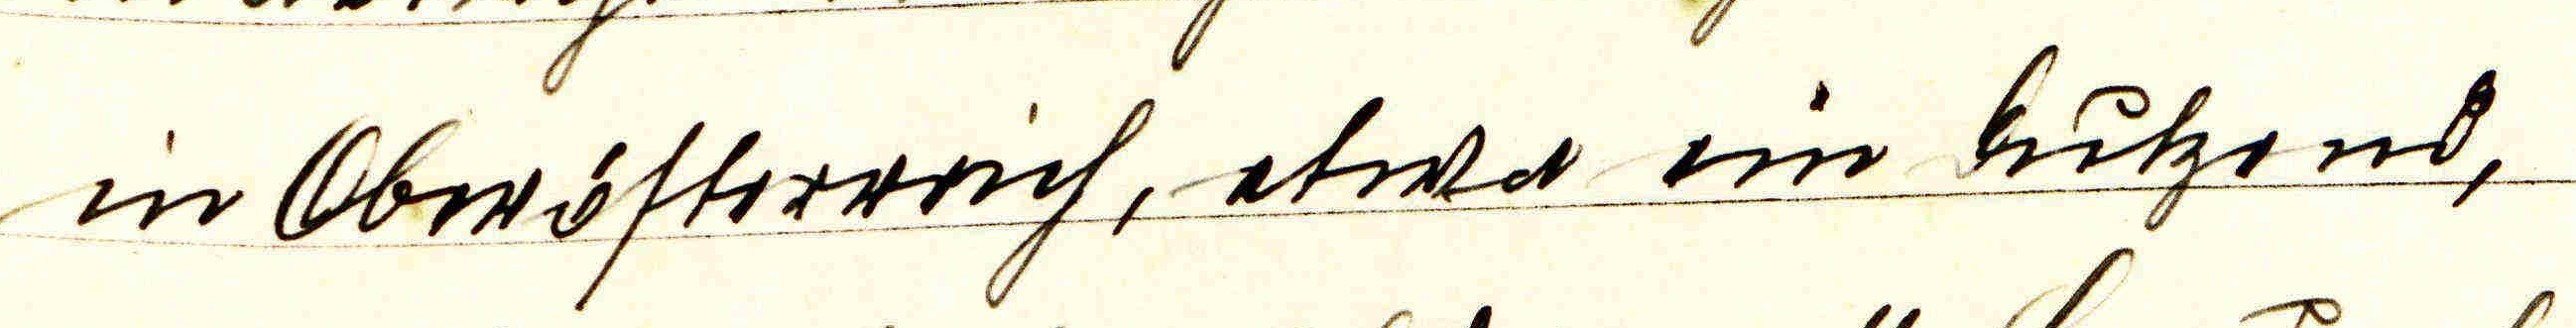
in Oberösterreich, etwa ein Dutzend,
